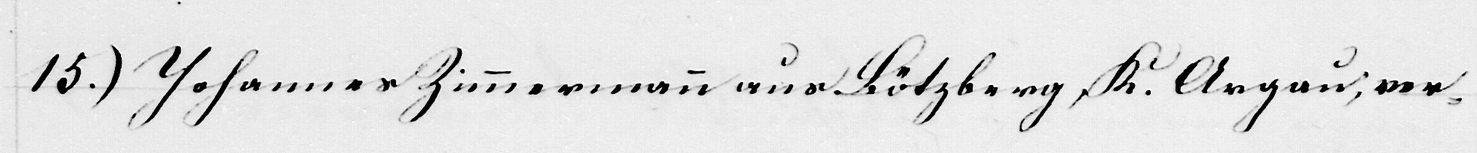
15.) Johannes Zimmermann aus Lötzberg, K. Argau, ver¬
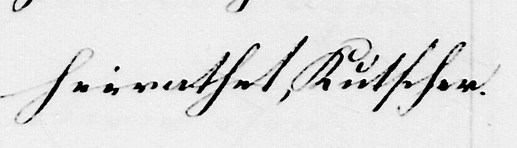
heirathet Kutscher.
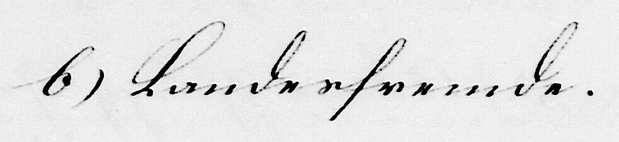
b) Landesfremde.
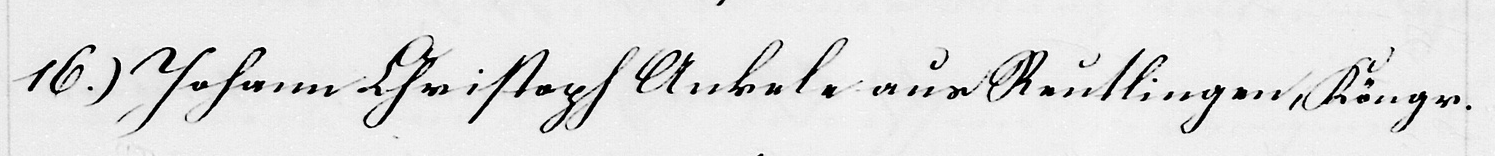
16.) Johann Christoph Ankele aus Reutlingen, Köngr.
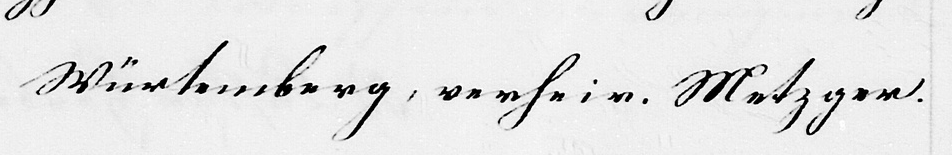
Würtemberg, verheir. Metzger.
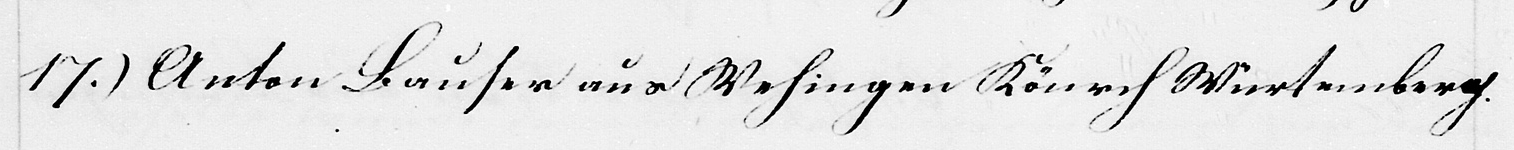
17.) Anton Bauser aus Wehingen Könrch Würtemberg.
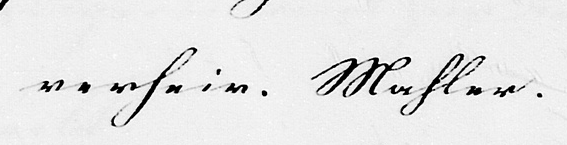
verheir. Mahler.
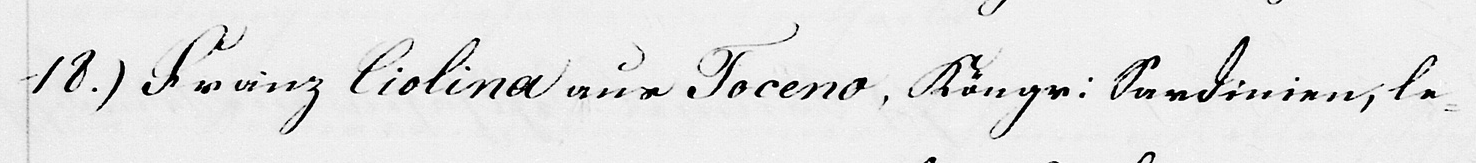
18.) Franz Ciolina aus Toceno, Köngr: Sardinien, le¬
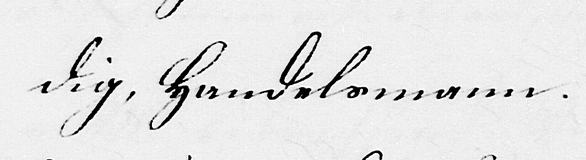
dig, Handelsmann.
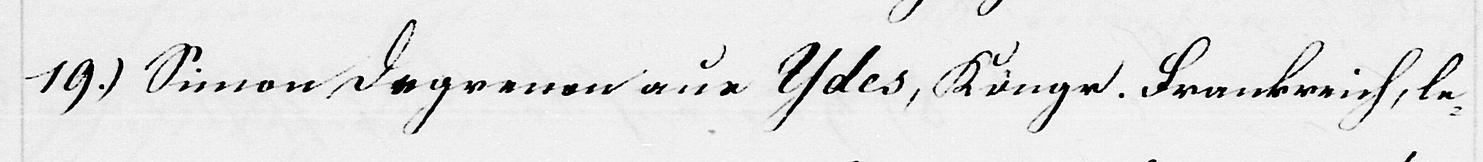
19.) Simon Degrenen aus Ydes, Köngr. Frankreich, le¬
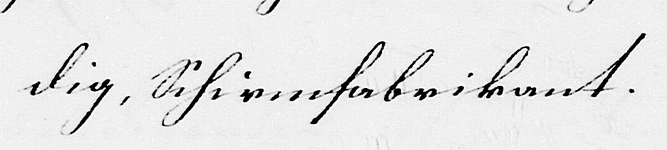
dig, Schirmfabrikant.
